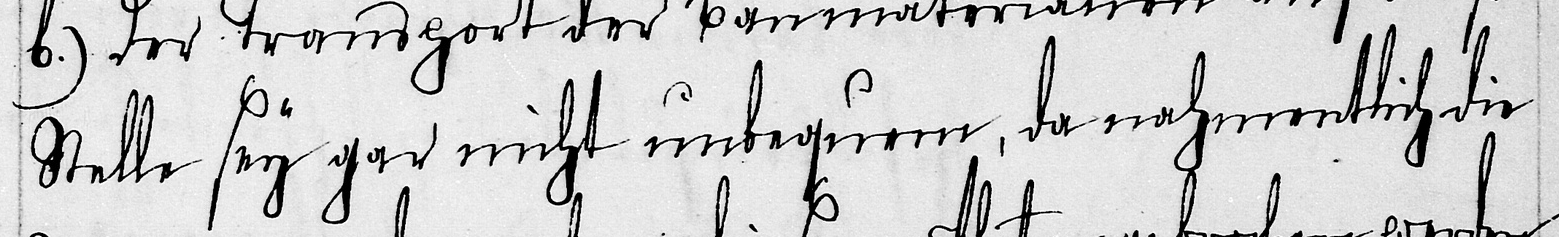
Stelle sey gar nicht unbequem, da nahmentlich die
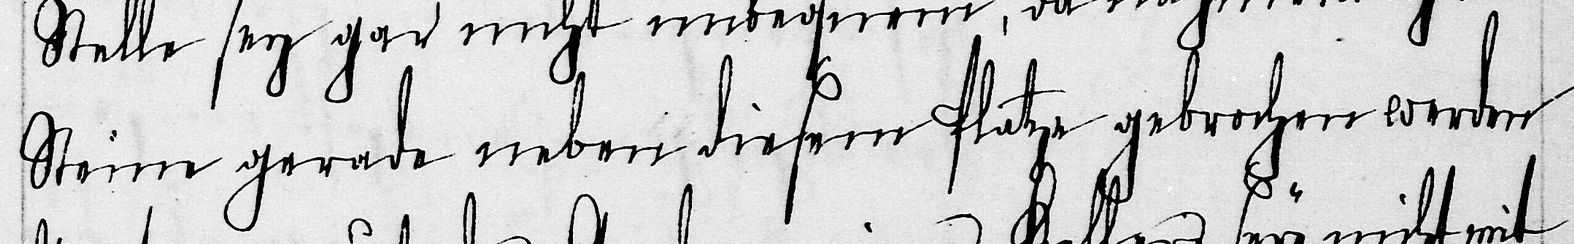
Steine gerade neben diesem Platze gebrochen werden
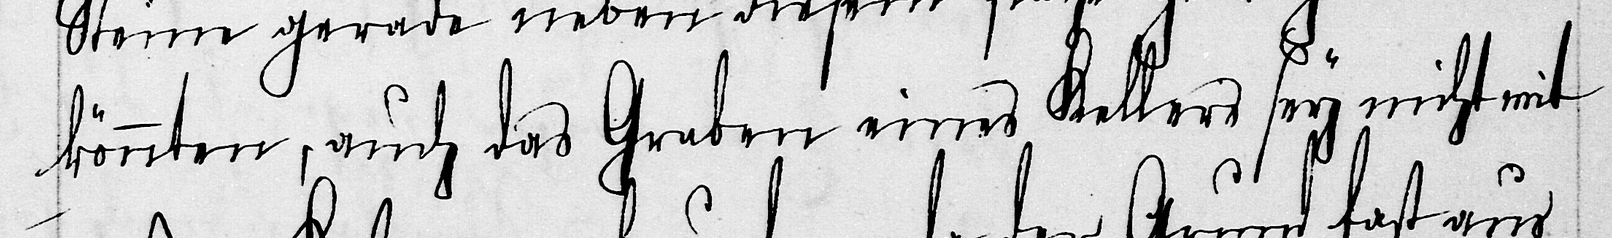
könnten, auch das Graben eines Kellers sey nicht mit
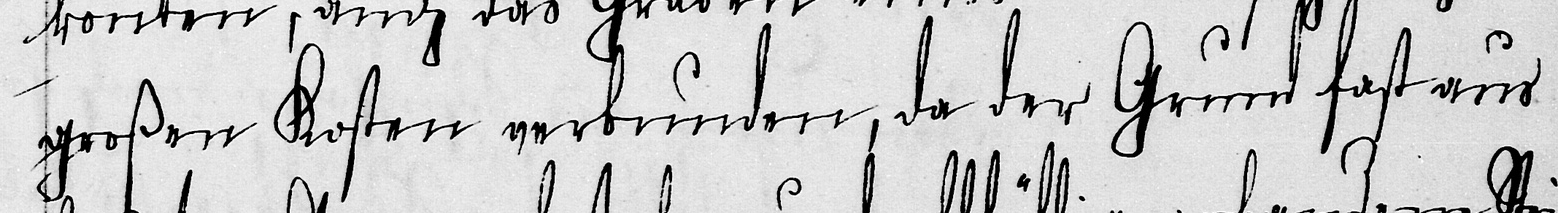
großen Kosten verbunden, da der Grund fast aus
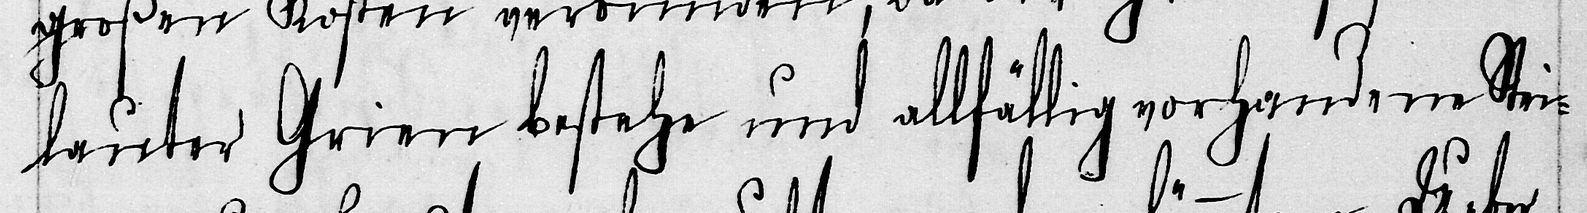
lauter Grien bestehe und allfällig vorhandene Stei¬
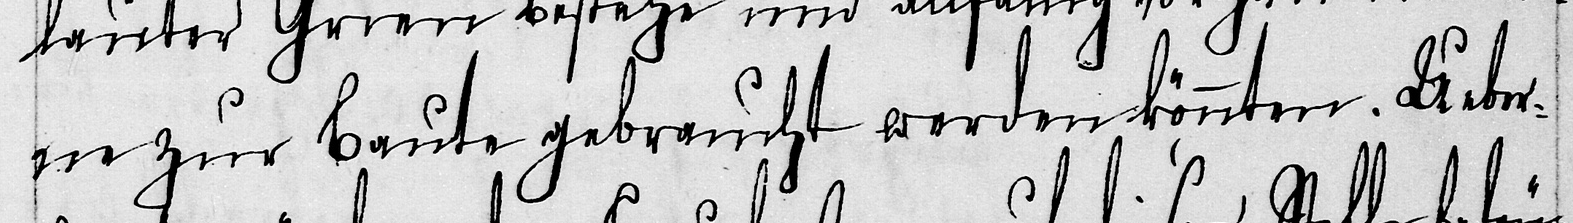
ne zur Baute gebraucht werden könnten. Ueber¬
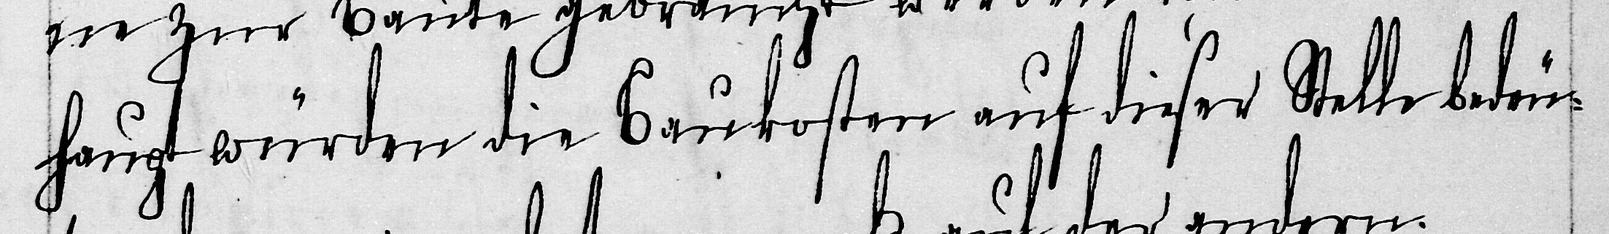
haupt würden die Baukosten auf dieser Stelle bedeu¬
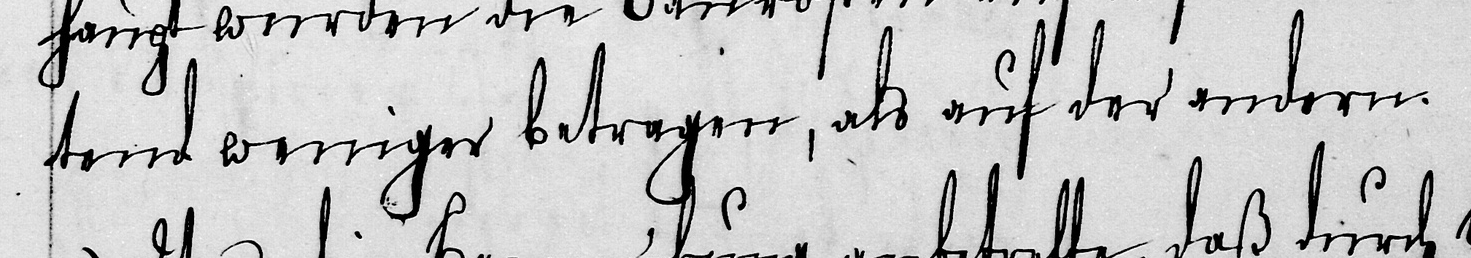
tend weniger betragen, als auf der andern.
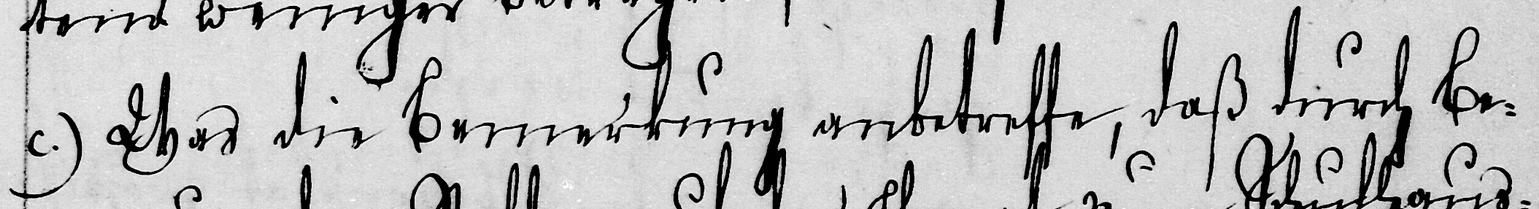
c.) Was die Bemerkung anbetreffe, daß durch Be¬
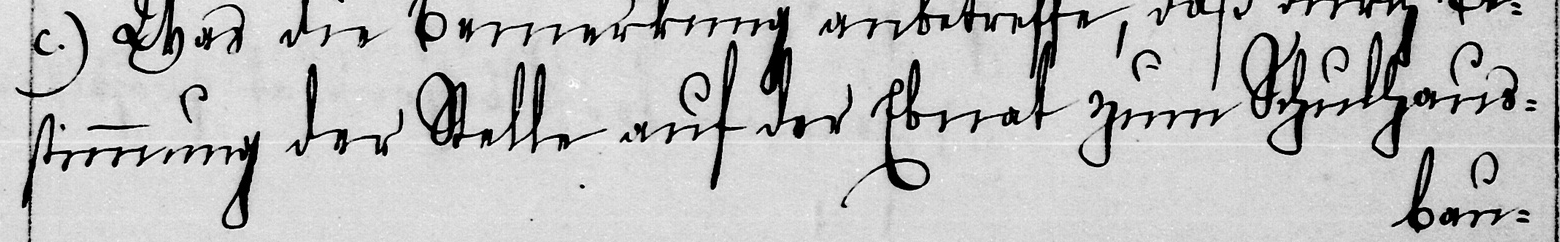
stimmung der Stelle auf der Ebnat zum Schulhaus-
